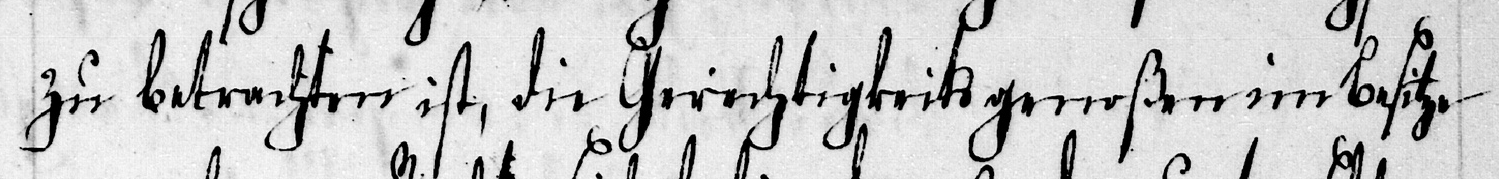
zu betrachten ist, die Gerechtigkeitsgenoßen im Besitze
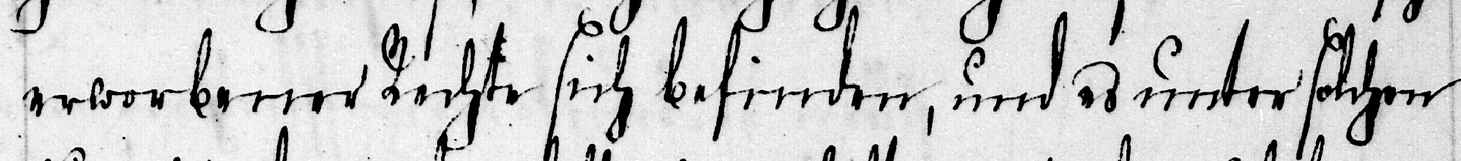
erworbener Rechte sich befinden, und es unter solchen
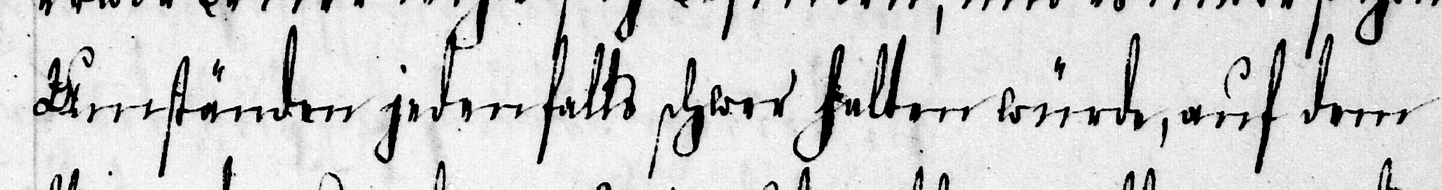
Umständen jedenfalls schwer halten würde, auf dem
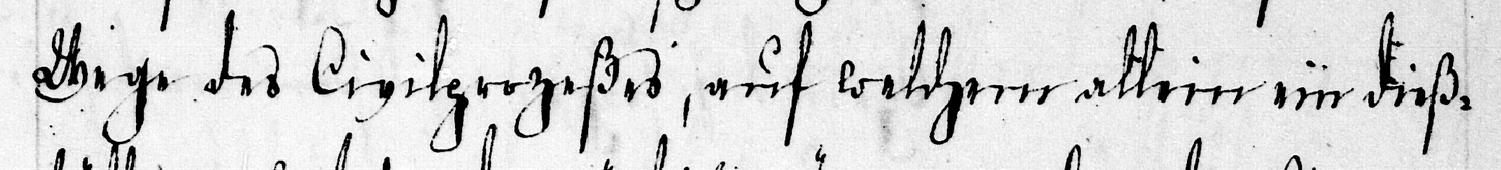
Wege des Civilprozeßes, auf welchem allein ein dieß¬
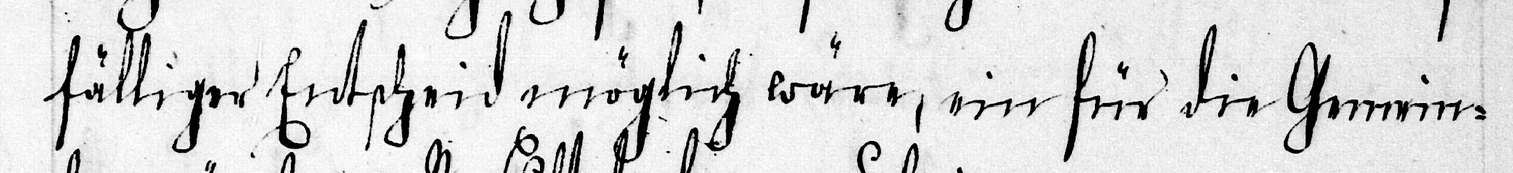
fälliger Entscheid möglich wäre, ein für die Gemein¬
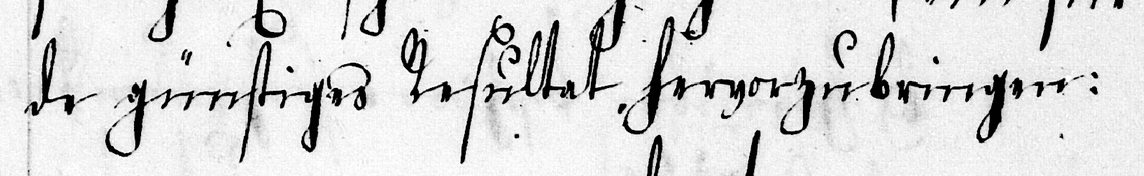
de günstiges Resultat hervorzubringen:
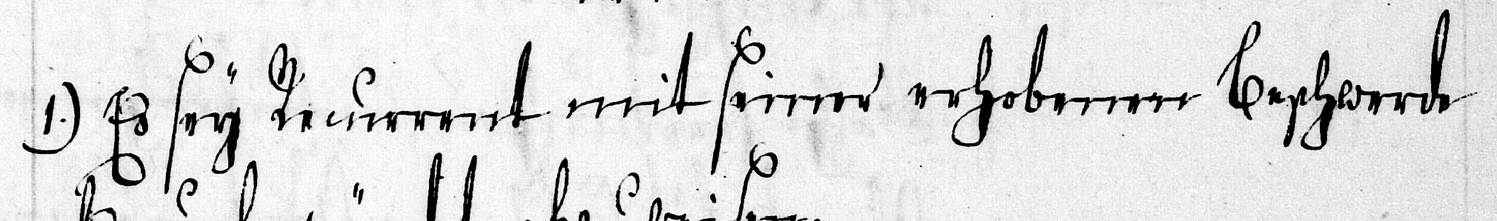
1.) Es sey Recurrent mir seiner erhobenen Beschwerde
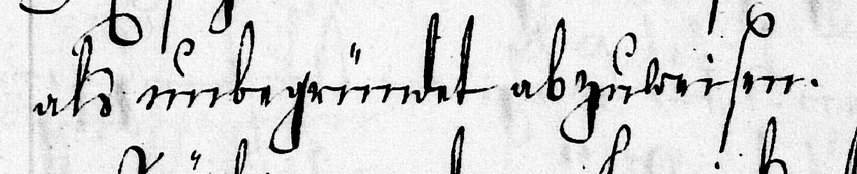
als unbegründet abzuweisen.
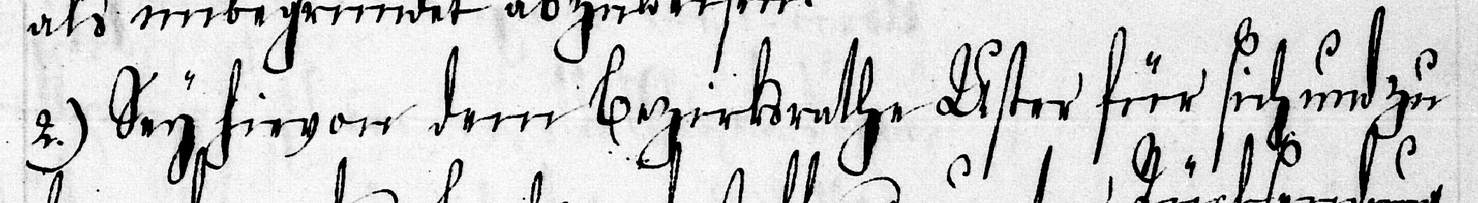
2.) Sey hievon dem Bezirksrathe Uster für sich und zu
